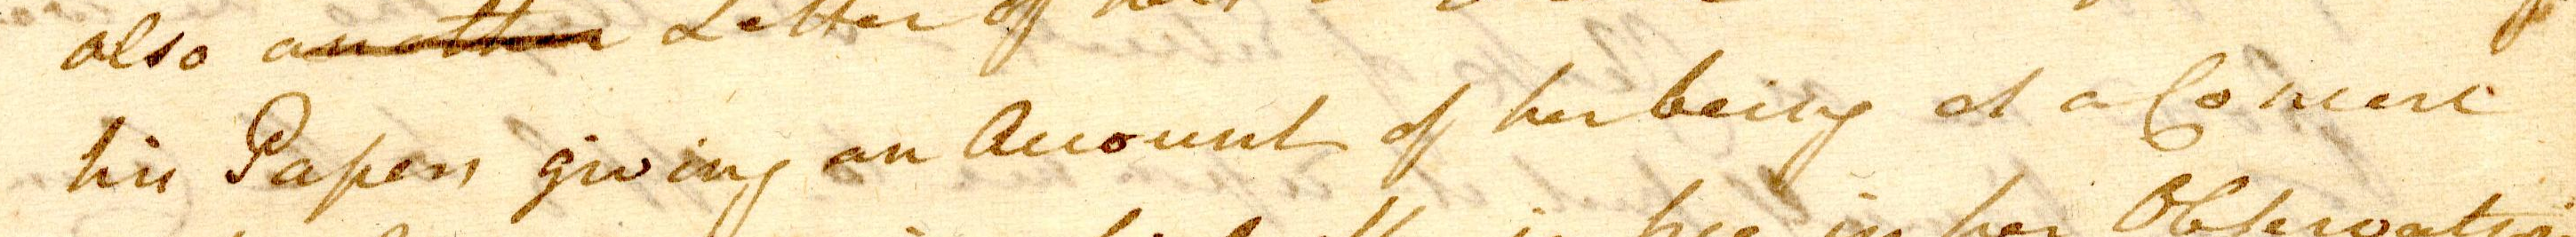his Papers giving an Account of her being of a Concert
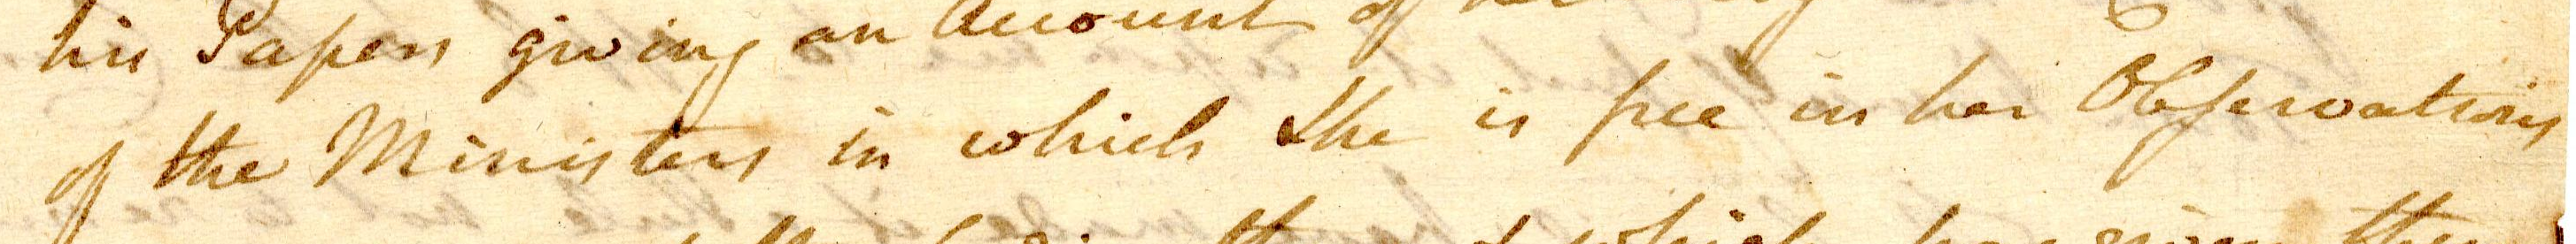of the Ministers in which she is free as her Observations
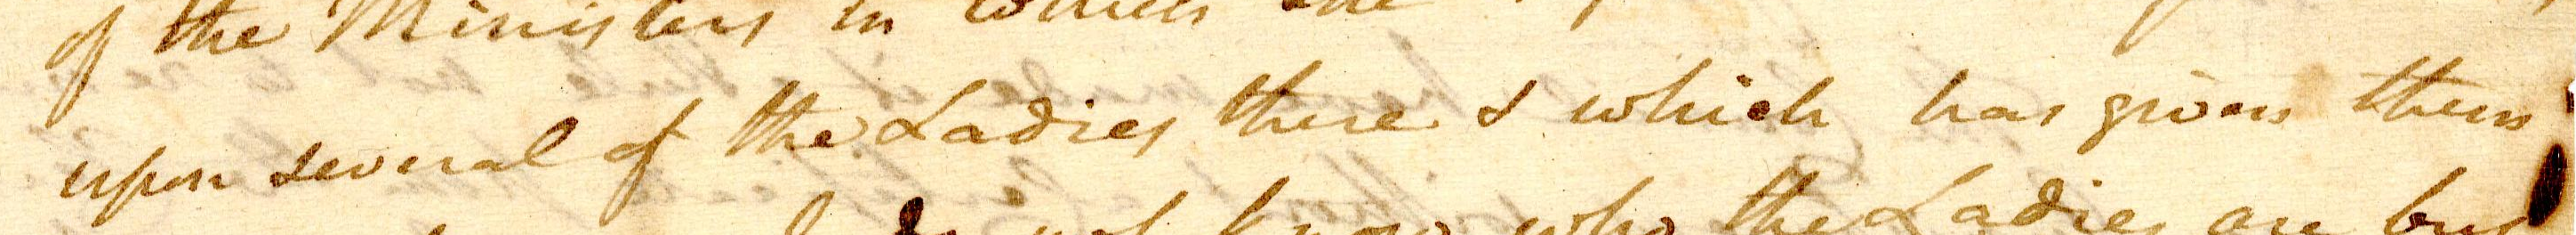upon several of the Ladies there & which has given them
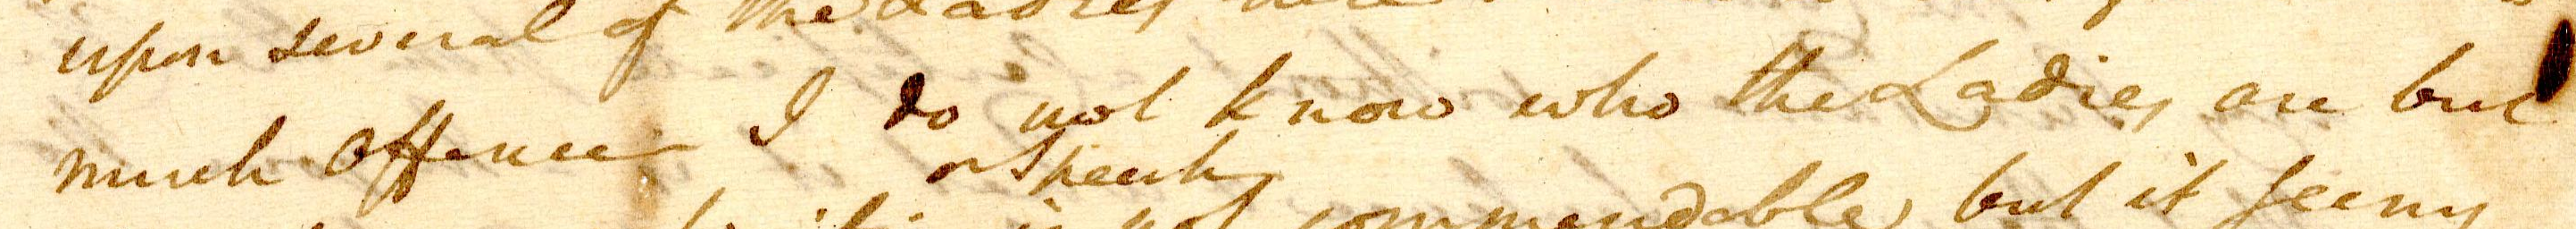much Offence. I do not know who the Ladies are but
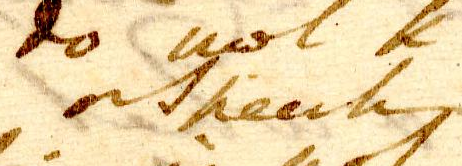a Speech
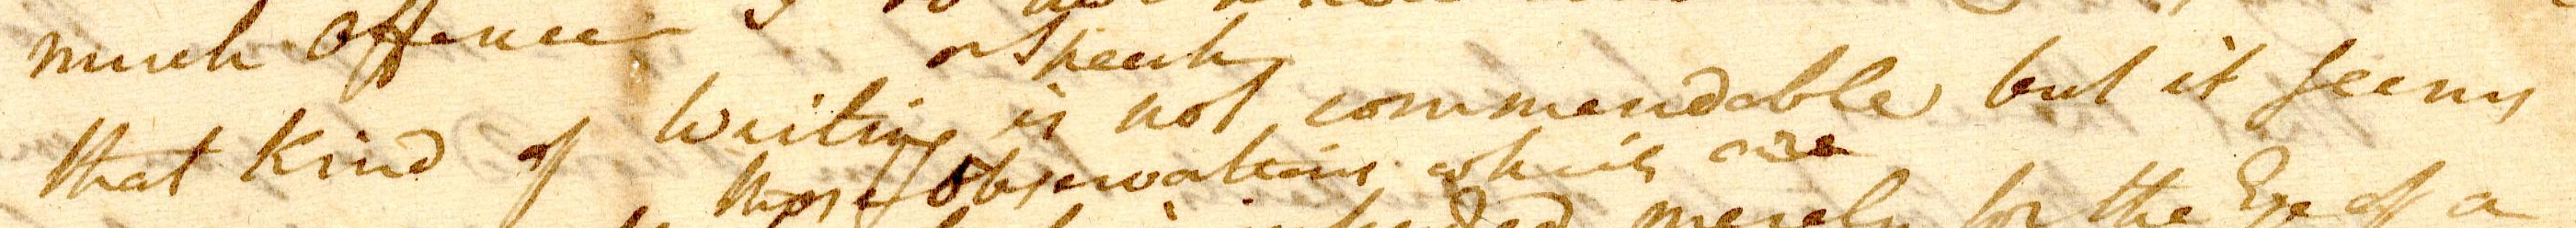that kind of Writing is not, commendable but it seems
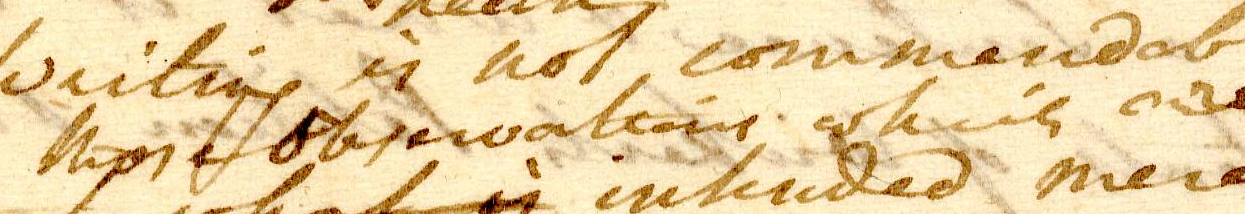those observations which are
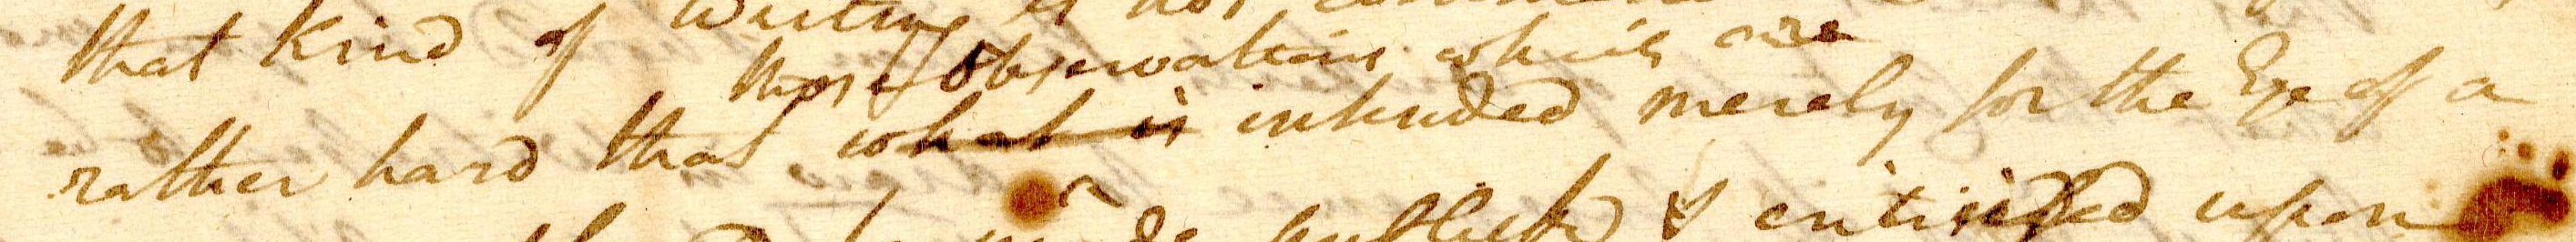rather hard that ^ what is intended merely for the Eye of a
